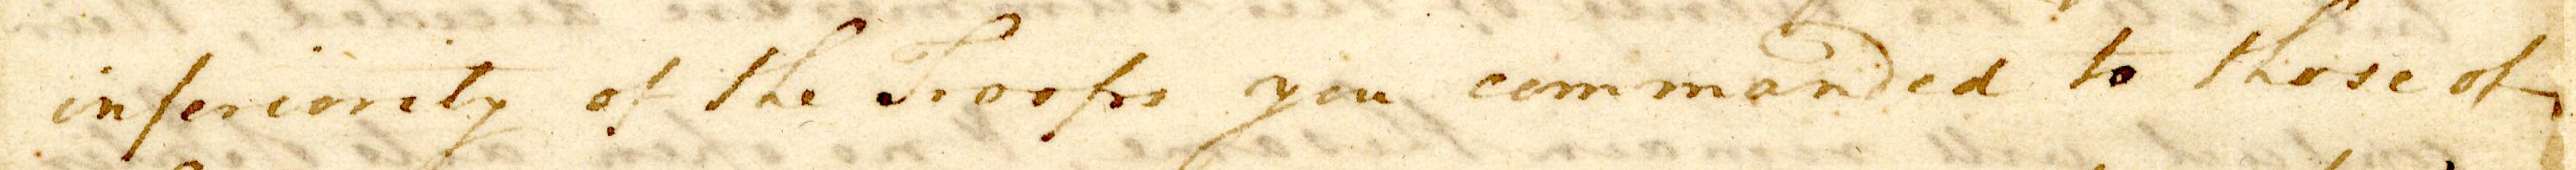inferiority of the Troops you commanded to those of
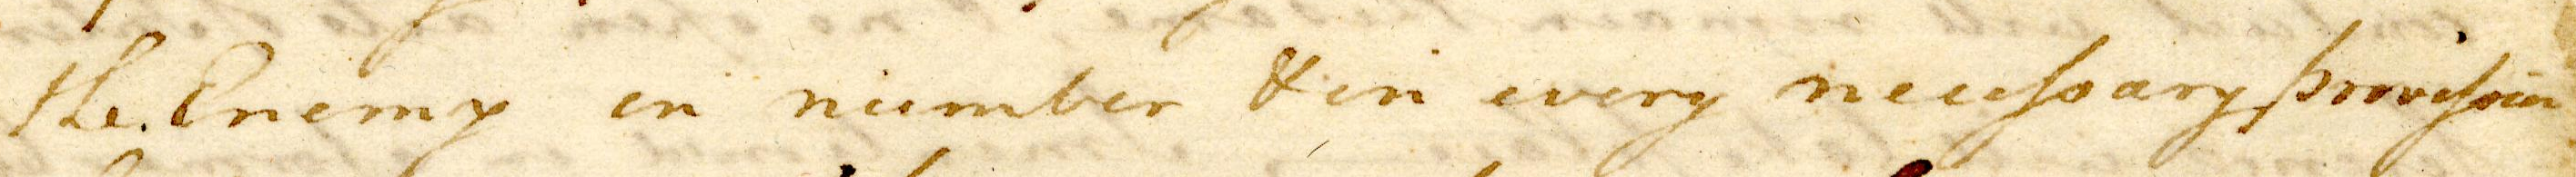the Enemy in number & in every necessary provision
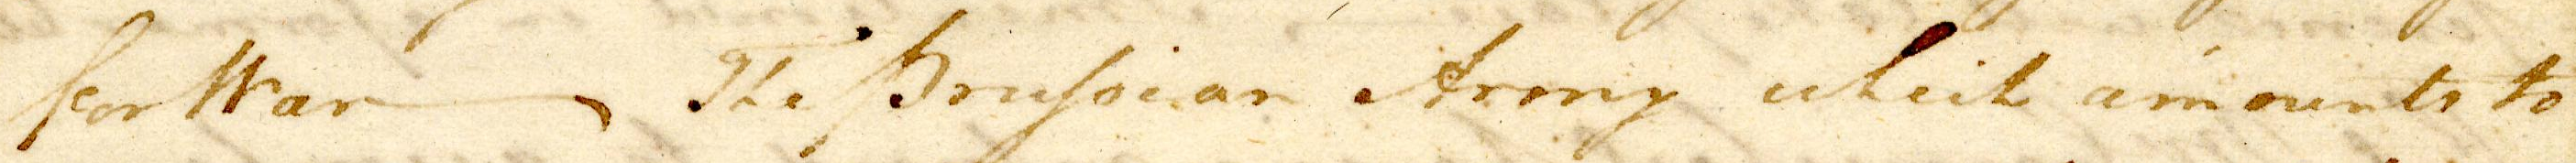for War.- The Prussian Army which amounts to
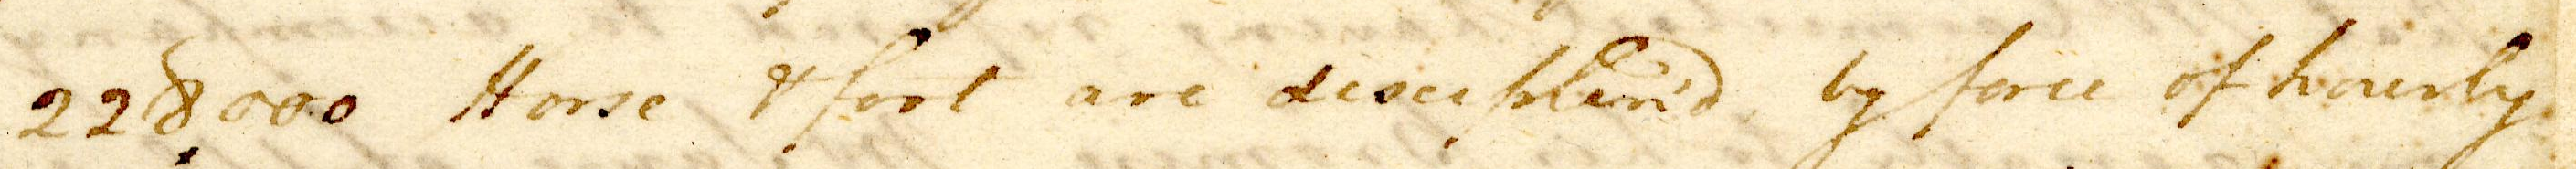228,000 Horse & foot are disciplin'd by force of hourly
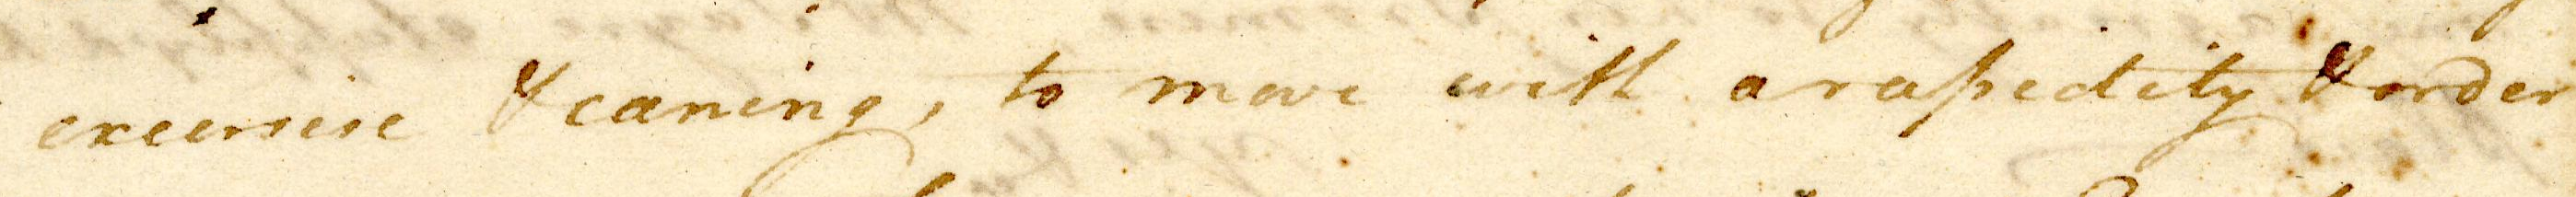exercise & caning, to move with a rapidity & order
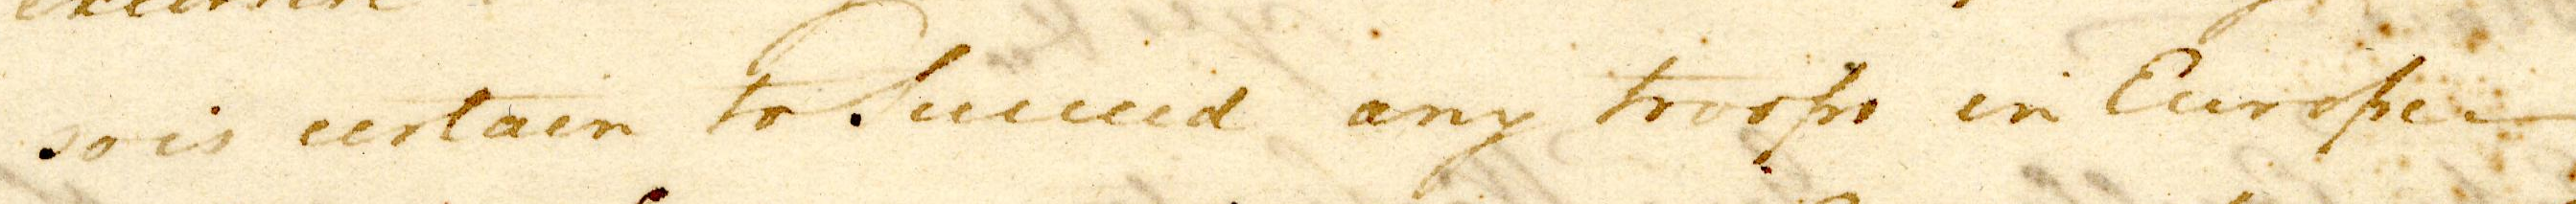so is certain to succeed any troops in Europe-
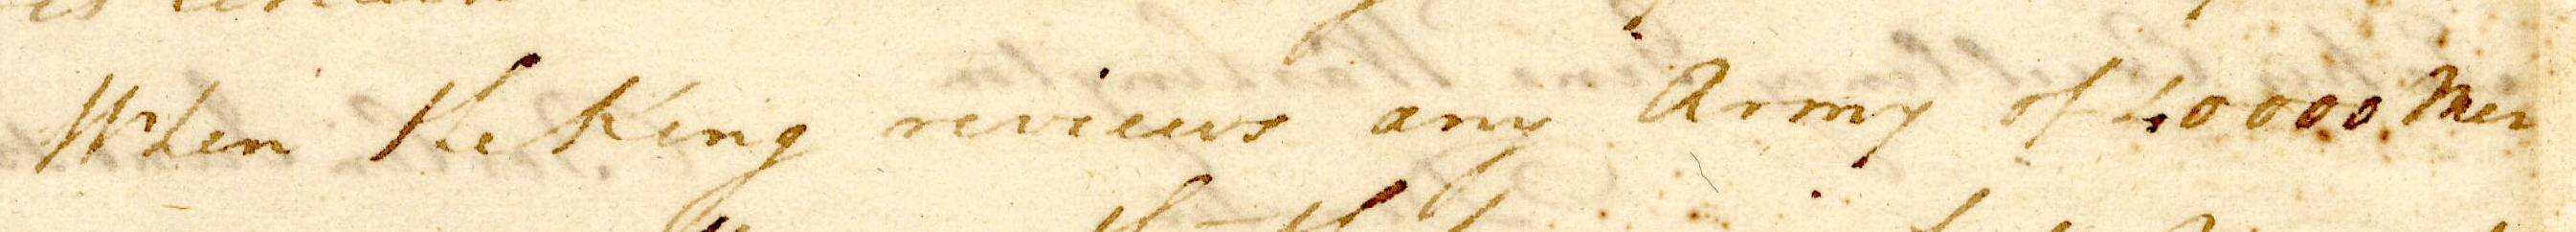When the king reviews any Army of 40,000 Men
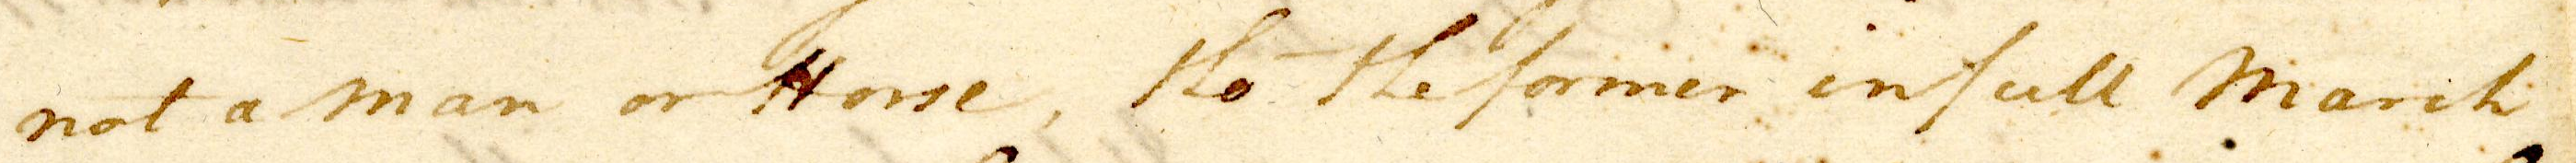not a man or Horse, Tho the former in full march
